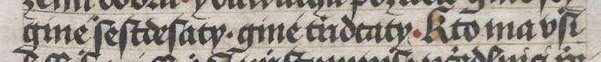gine ẛeſtdeſaty.giné tṙidcaty.Kto ma vẛi
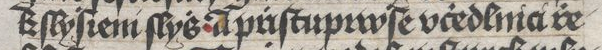kſlyẛieni ſlyṡ.Aa pṙiſtupiwẛe vċedlnici ṙe¬
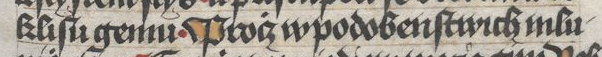kli ſu gemu.Procż w podobenſtwích mlu¬
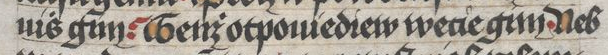uiṡ gim?Genż otpouiediew wecie gim.Neb
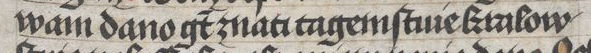wam dano ḡt znati tagemſtvíe kralow¬
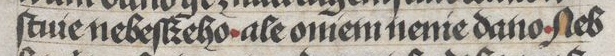ſtuie nebeſkeho.ale oniem neníe dano.Neb
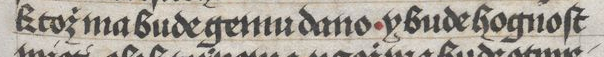ktoż ma bude gemu dano.y bude hognoſt
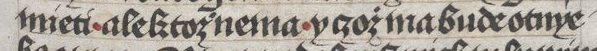mieti.ale ktoż nema.y czoż ma bude otnye¬
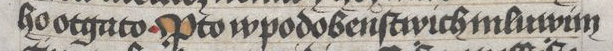ho otgato.Ꝓto w podobenſtwích mluwím
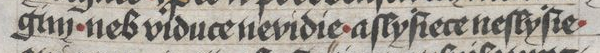gim.neb viduce nevidie.a ſlyẛíece neſlyẛie.
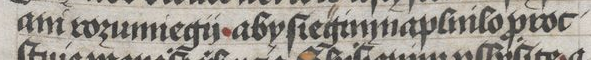ani rozumiegij.aby ſie gim naplnilo ꝓroc¬
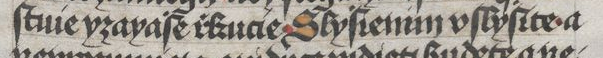ſtuie yzayaẛe ṙkucíe.Slyẛiením vſlyẛite.a
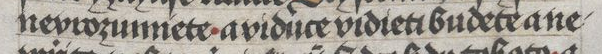neprozumiete.a viduce vidieti budete a ne¬
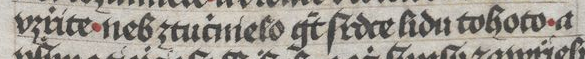vzṙite.neb ztuċnielo ḡt ſrdce lidu tohoto.a
